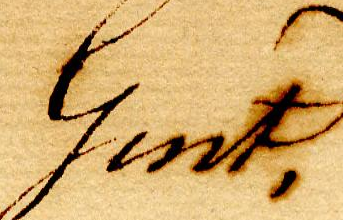Gent.
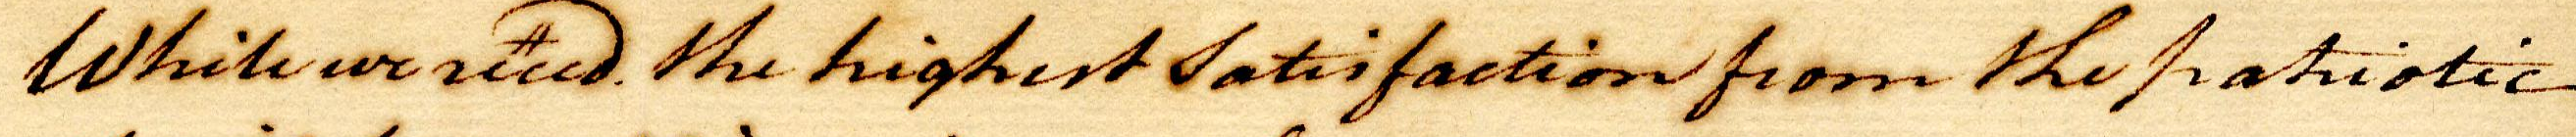While we reced. the highest Satisfaction from the patriotic
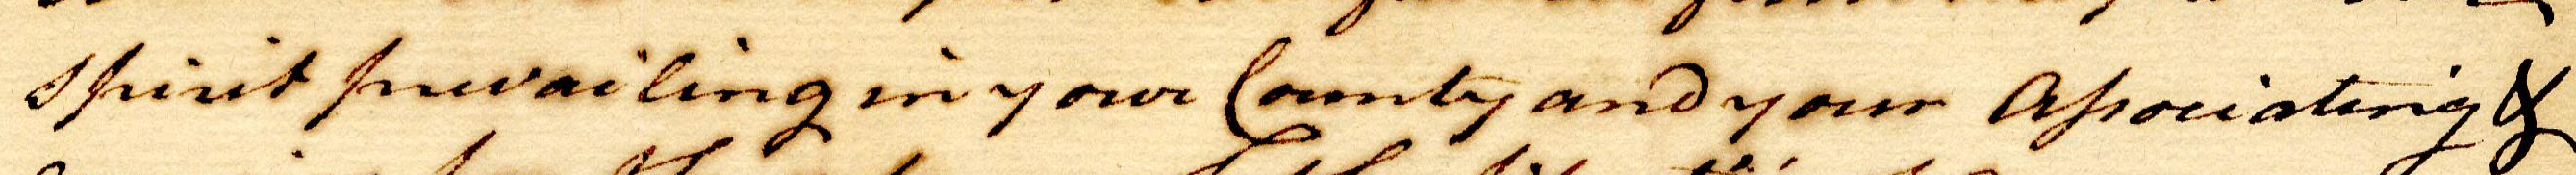spirit prevailing in your County and your Associating &
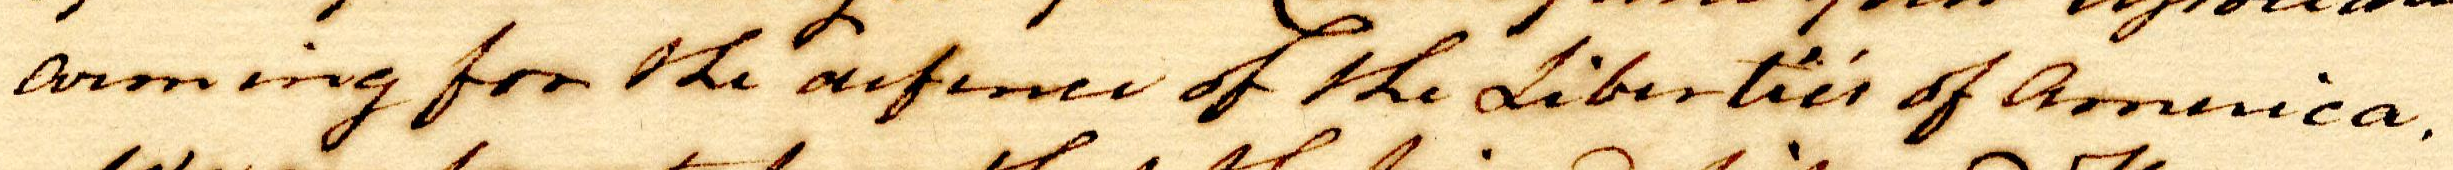arming for the defence of the Liberties of America
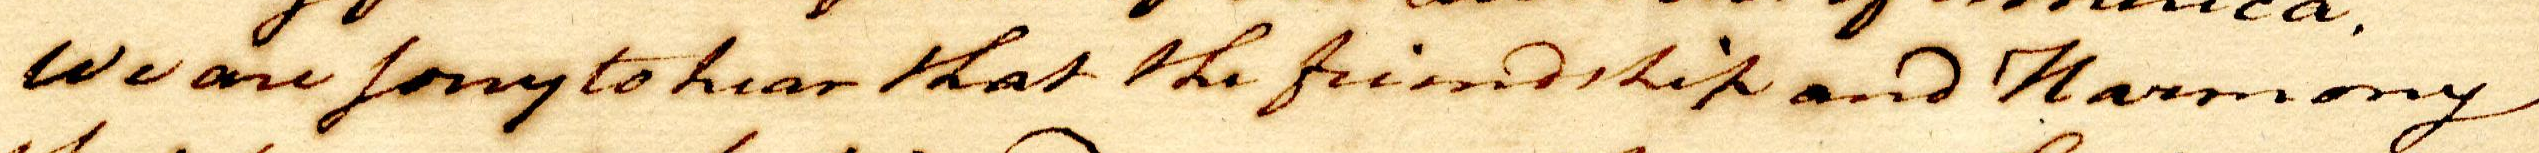We are sorry to hear that the friendship and Harmony
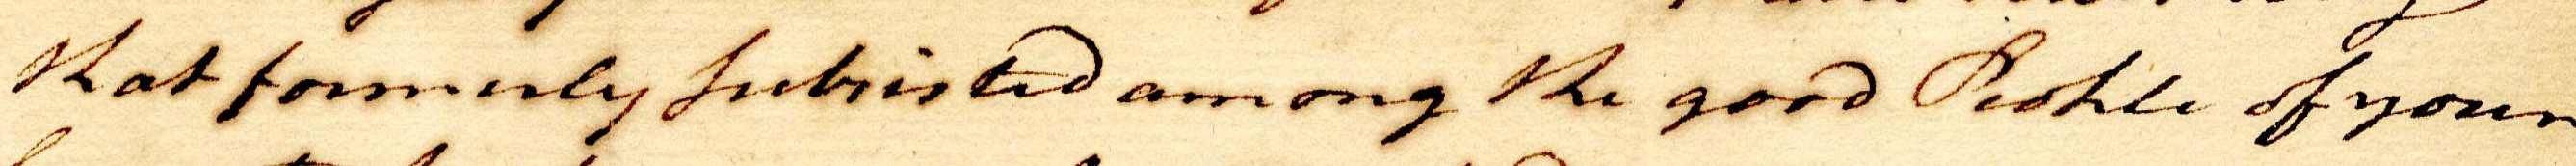that formerly subsisted among the good People of your
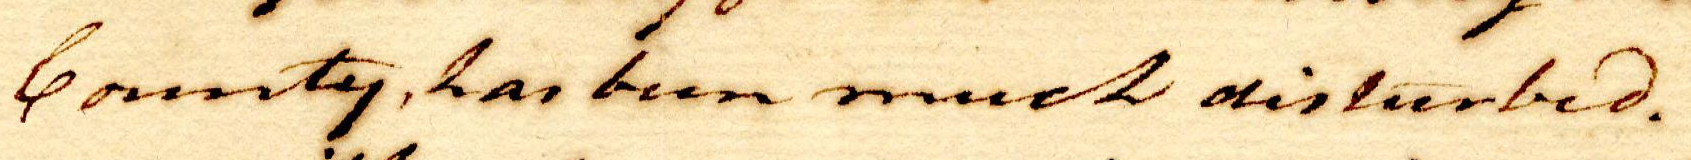County, has been much disturbed.
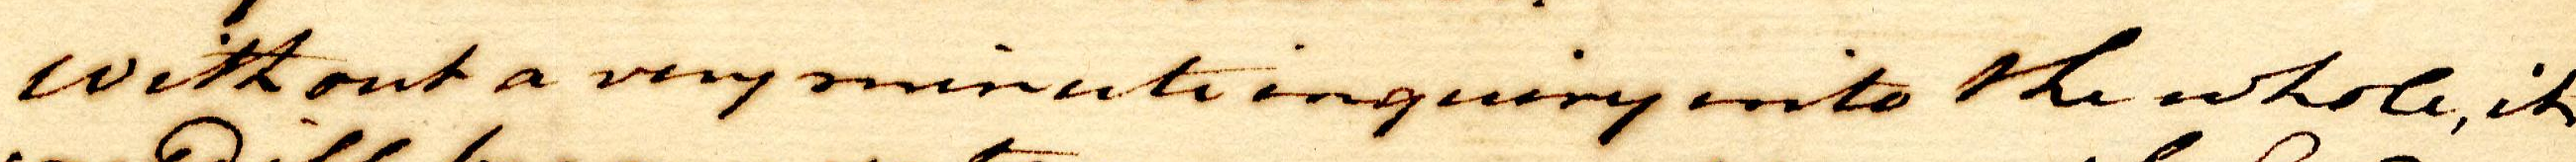Without a very minute inquiry into the whole, it
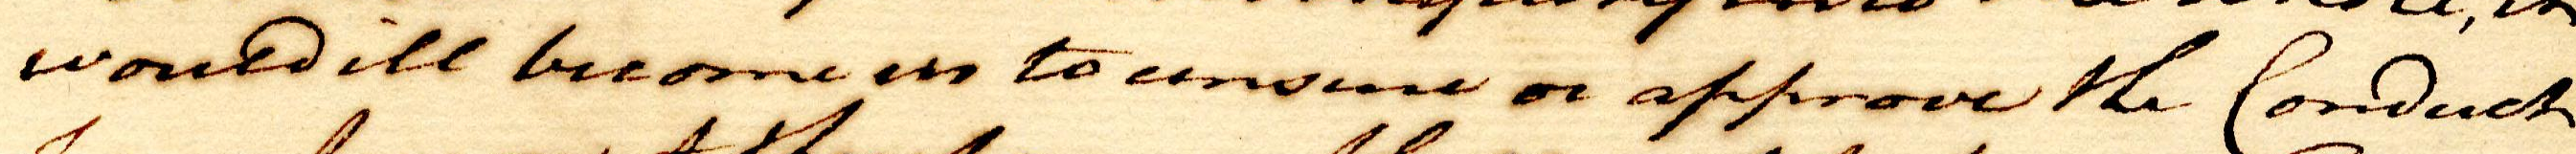would ill become us to censure or approve the Conduct
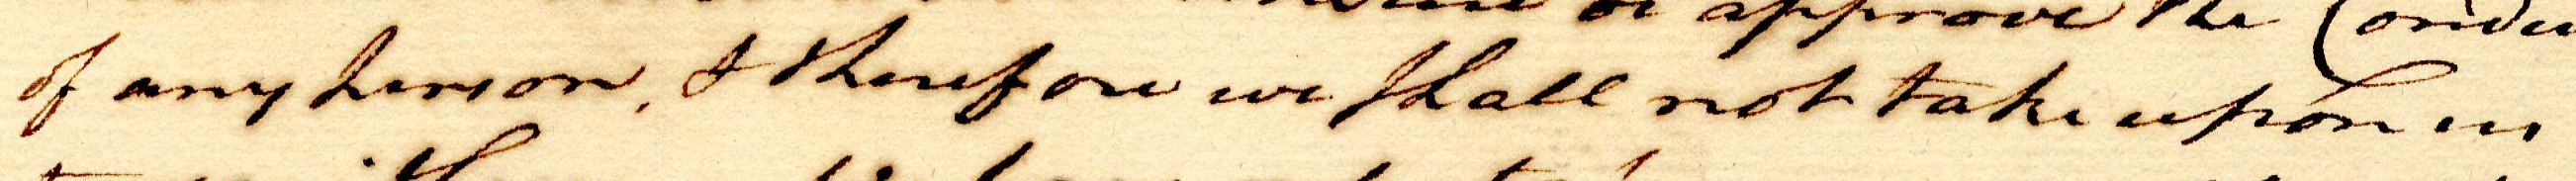of any Person, & therefore we shall not take upon in
